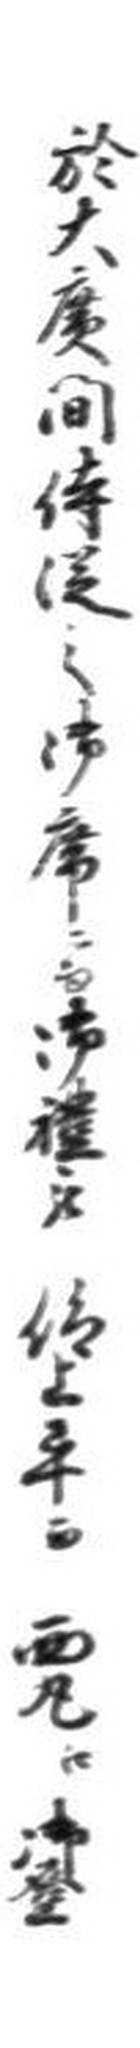於大廣間侍従之御席ニ而御礼被仰上畢而西丸え御登
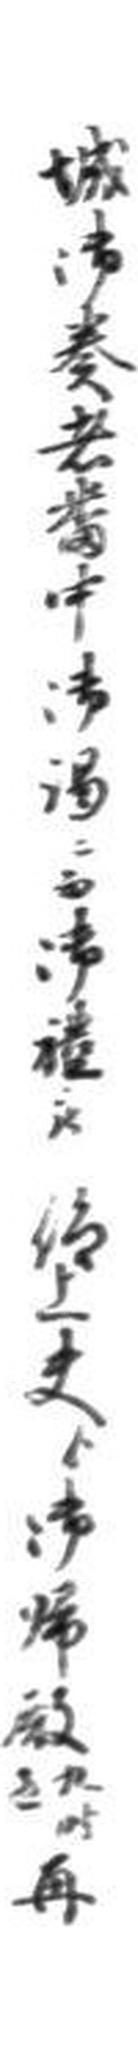城御奏者番中御謁ニ而御礼被仰上夫ゟ御帰殿九時過再
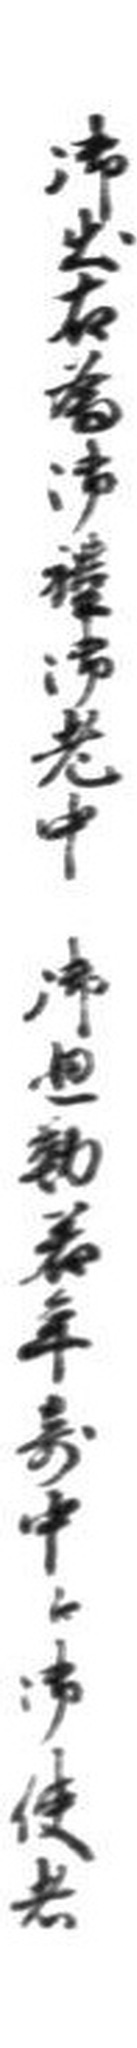御出右為御礼御老中御廻勤若年寄中え御使者

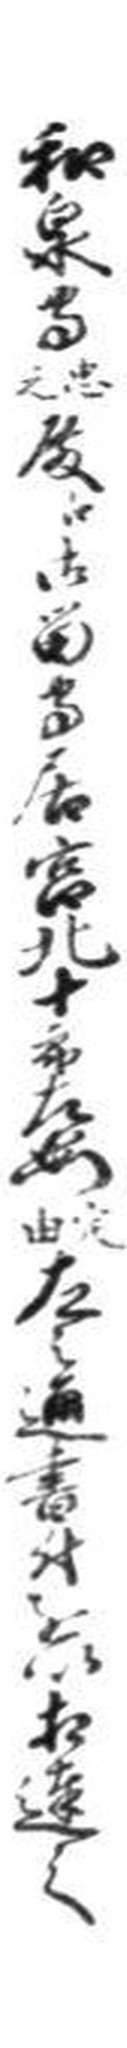和泉守忠之殿江御留守居宮北十郎左衛門定由左之通書付を以相達之
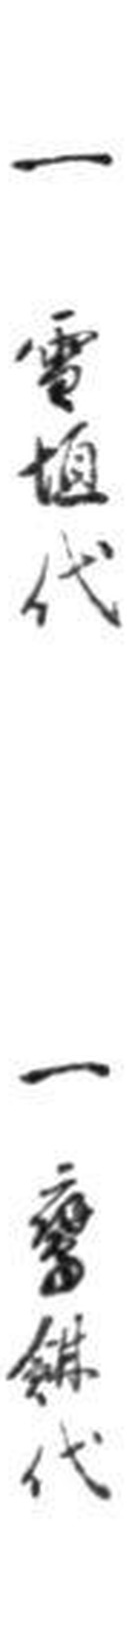一雪垣代一鷹代
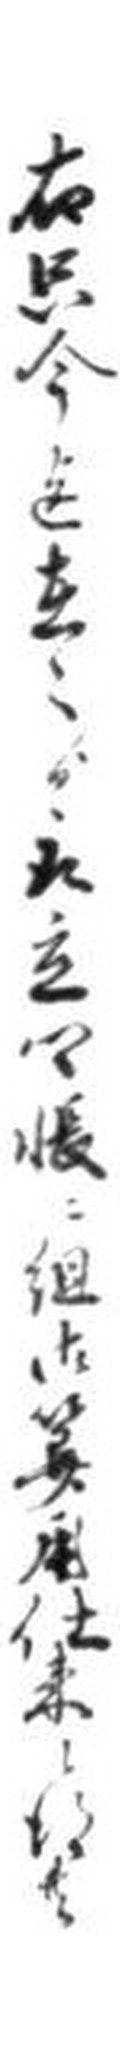右只今迄在々ゟ取立郷帳ニ組御算用仕来候得共
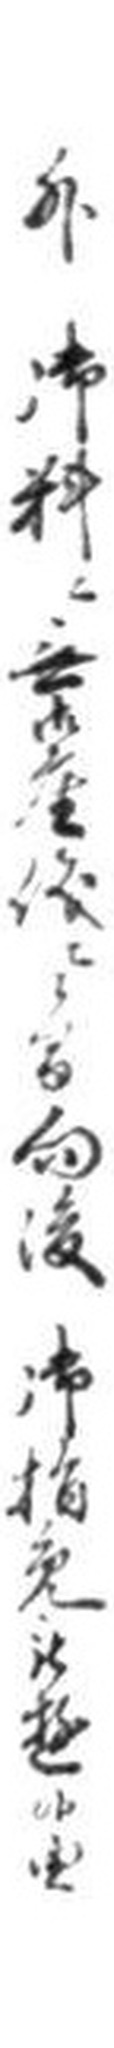外御料ニ無御座儀ニ候間向後御指免被遊候由
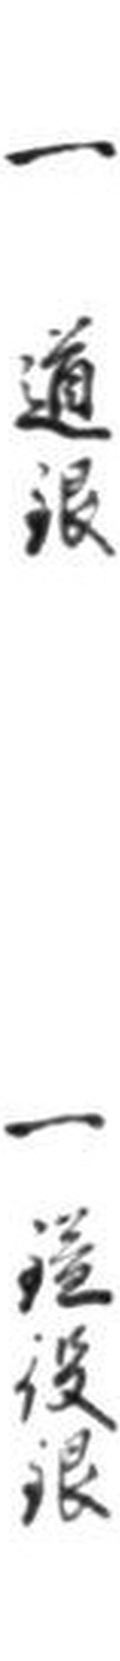一道銀一鎰役銀
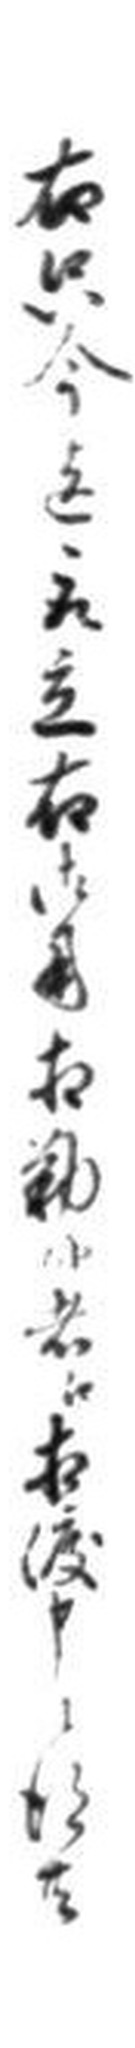右只今迄取立右御用相勤候者江相渡申候得共
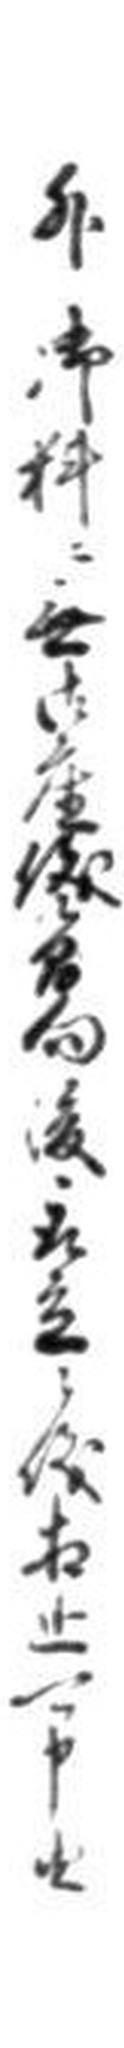外御料ニ無御座儀候間向後取立候儀相止可申由
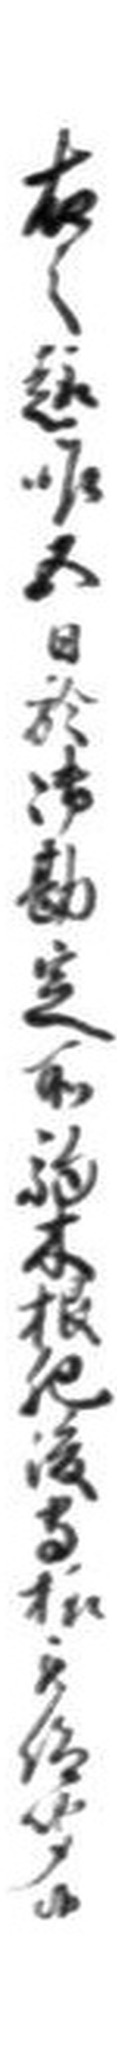右之趣昨五日於御勘定所駒木根肥後守様被仰聞候
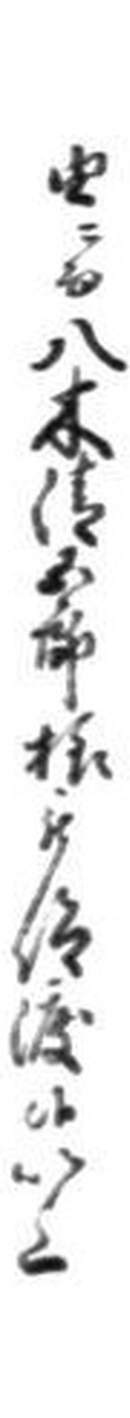由ニ而八木清五郎様被仰渡候以上
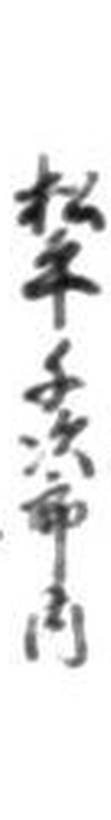松平千次郎内
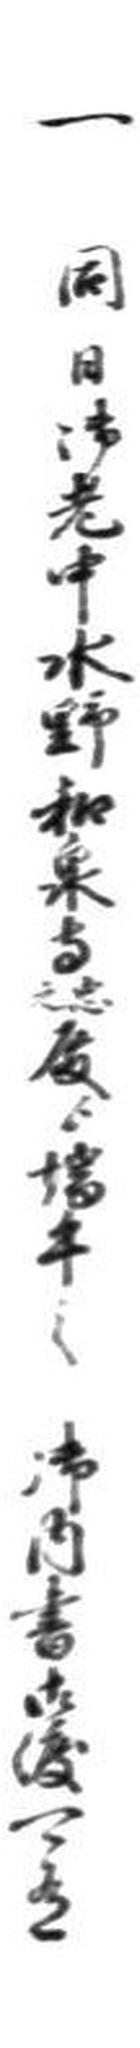一同日御老中水野和泉守忠之殿ゟ端午之御内書御渡可有
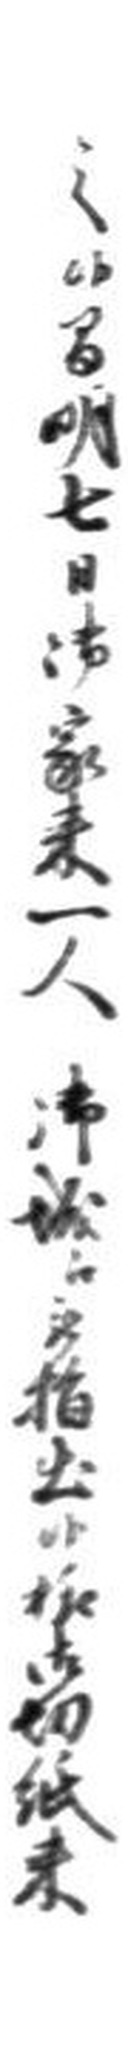之候間明七日御家来一人御城江被指出候様御切紙来
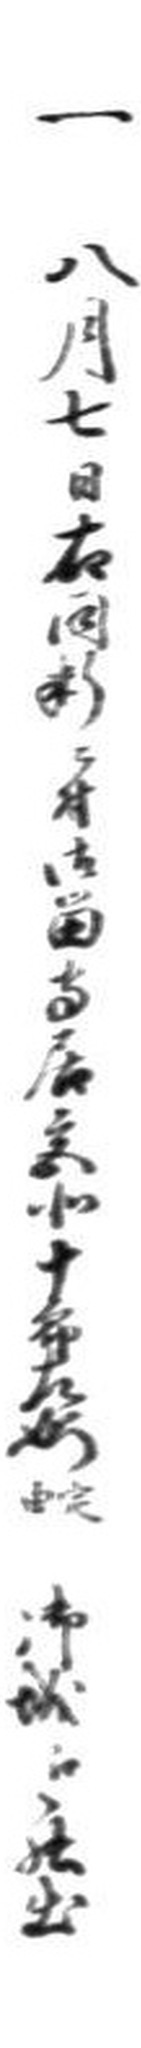一八月七日右同断ニ付御留守居宮北十郎左衛門定由御城江罷出
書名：家譜 四十 宗矩公 従享保十一年到享保十二年
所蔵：福井県文書館 Fukui Prefectural Archives
